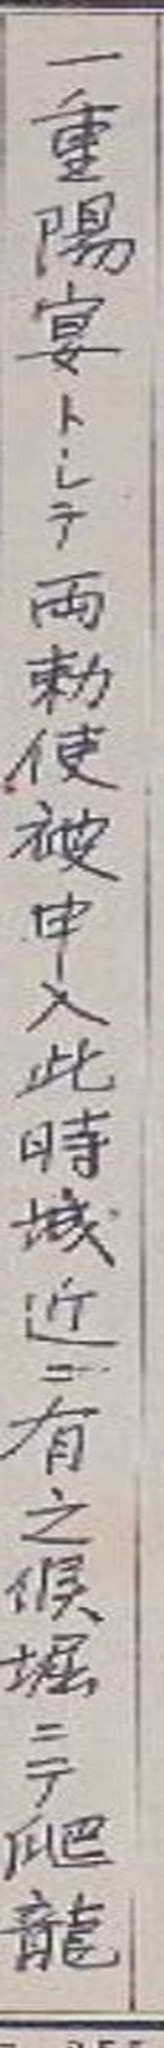一重陽宴として両勅使被申入此時城近に有之候堀にて爬龍
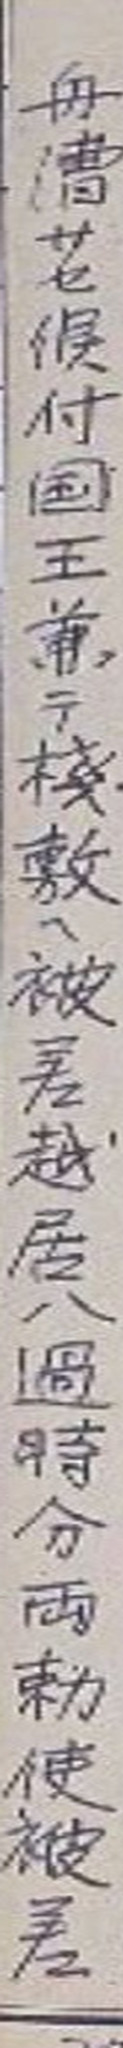舟漕させ候付国王兼て桟敷へ被差越居八過時分両勅使被差
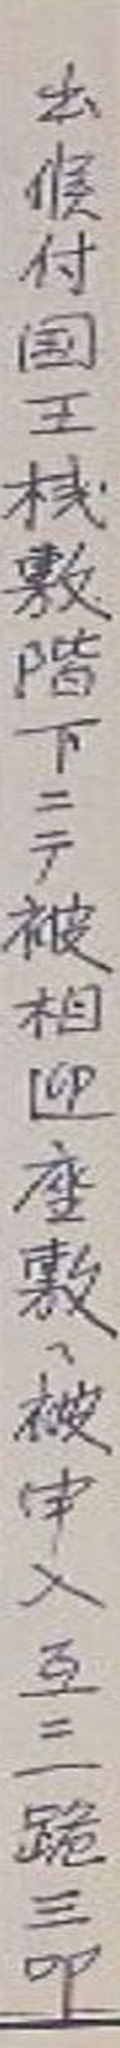出候付国王桟敷階下にて被相迎座敷へ被申入互に一跪三叩
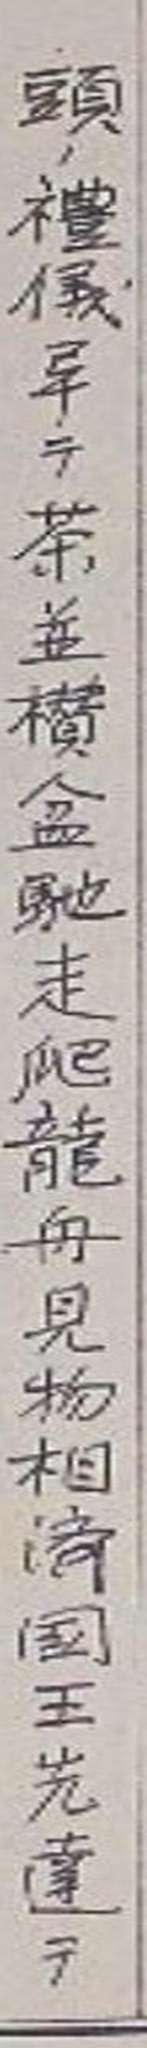頭の礼儀畢て茶並櫕盆馳走爬龍舟見物相済国王先達て
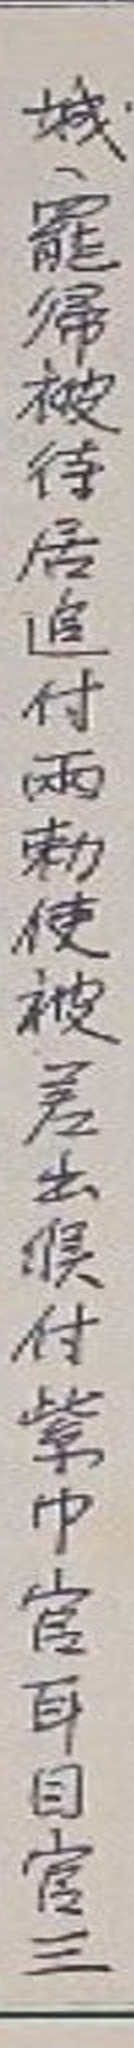城へ罷帰被待居追付両勅使被差出候付紫巾官耳目官三
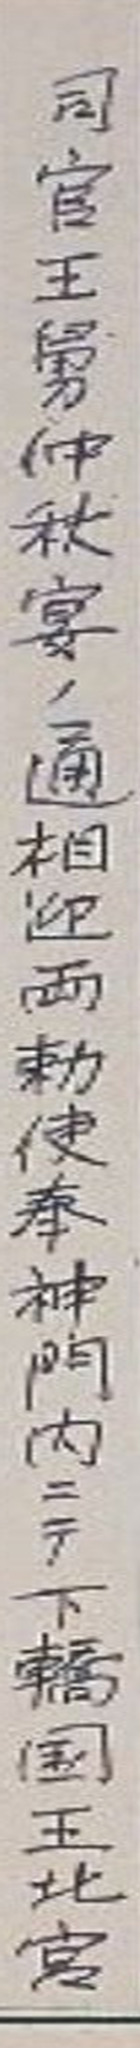司官王舅仲秋宴の通相迎両勅使奉神門内にて下轎国王北宮
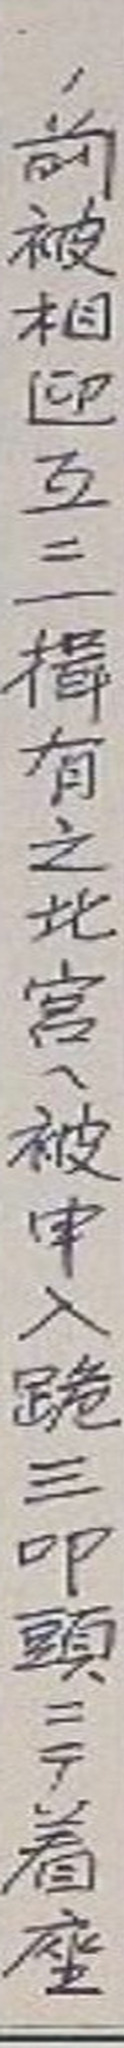の前被迎互に一揖有之北宮へ被申入跪三叩頭にて着座
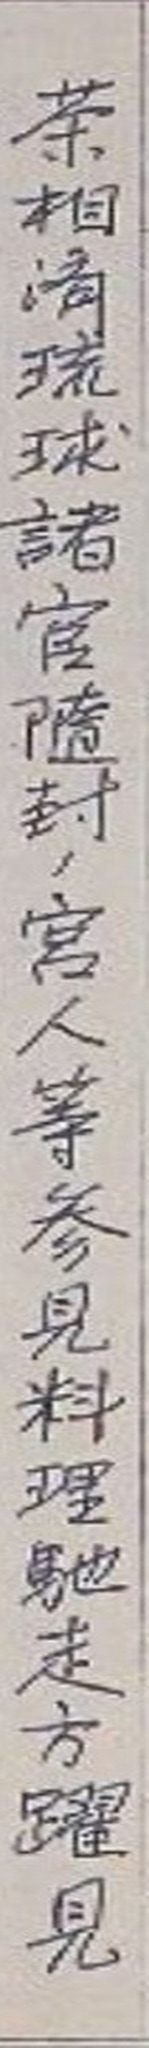茶相済琉球諸官随封の宮人等参見料理馳走方躍見
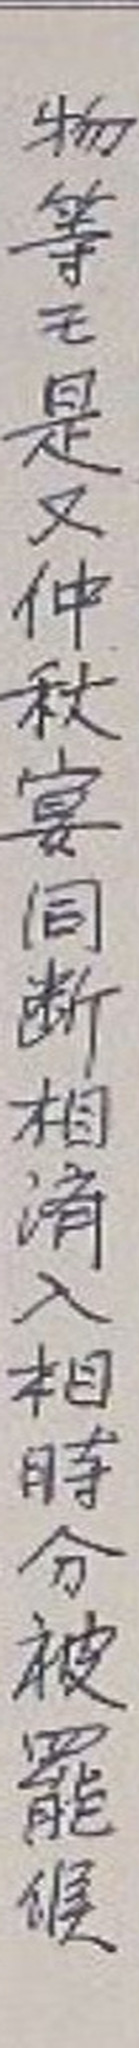物等も是又仲秋宴同断相済入相時分被罷候
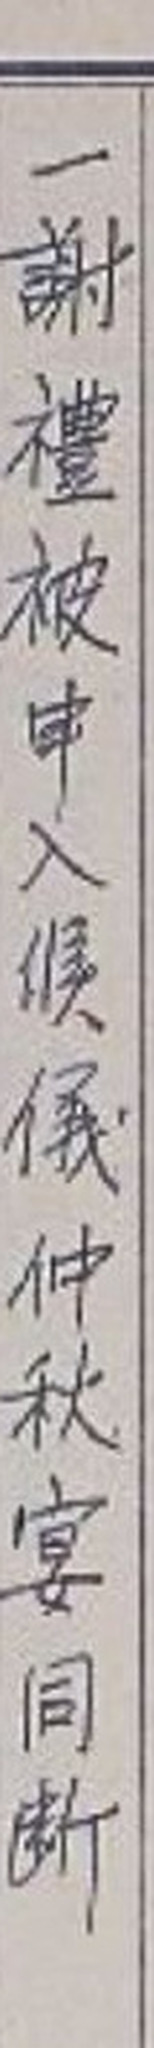一謝礼被申入候儀仲秋宴同断
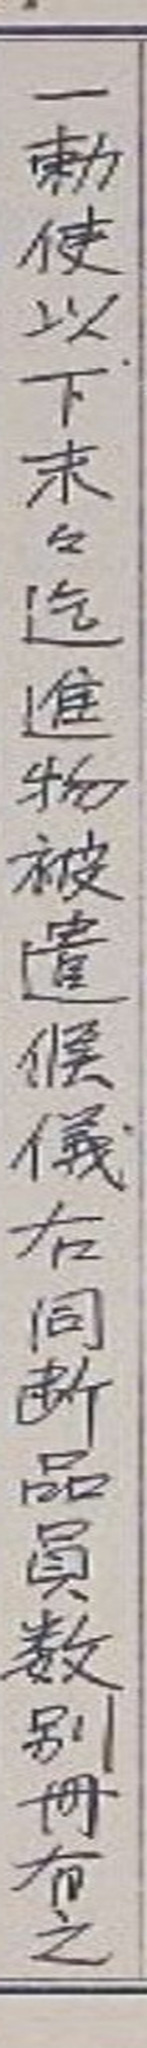一勅使以下末々迄進物被遣候儀右同断品員数別冊有之
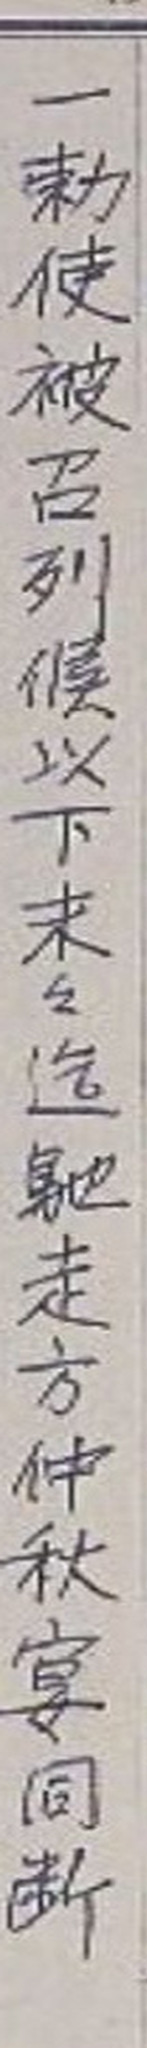一勅使被召列候以下末々迄馳走方仲秋宴同断
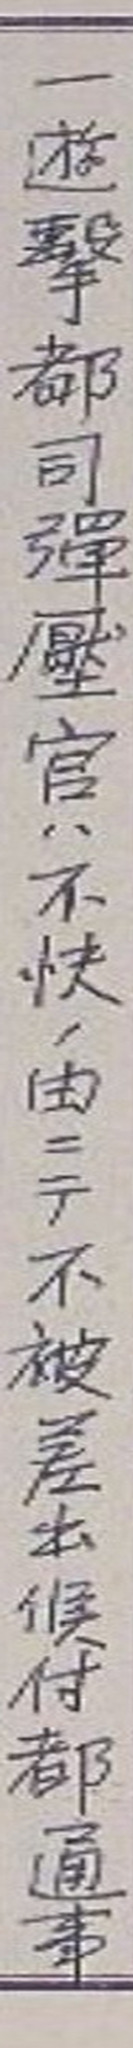一遊撃都司弾圧官は不快の由にて不差出候付都通事
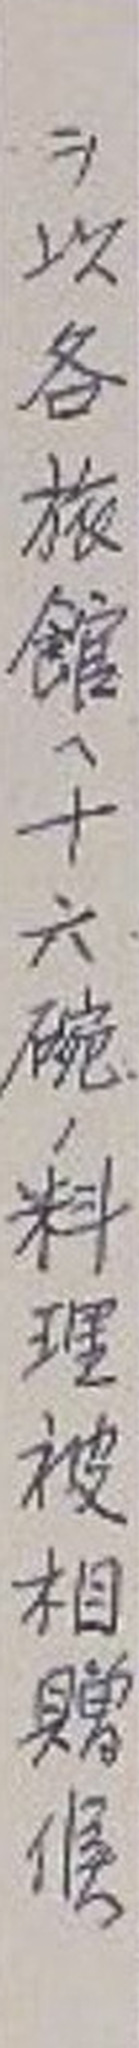を以各旅館へ十六碗の料理被差贈候

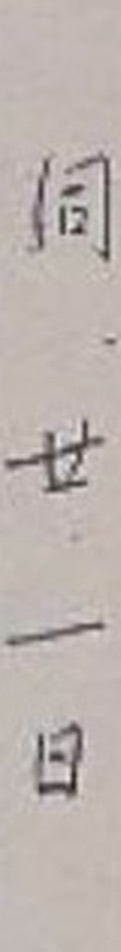同廿一日
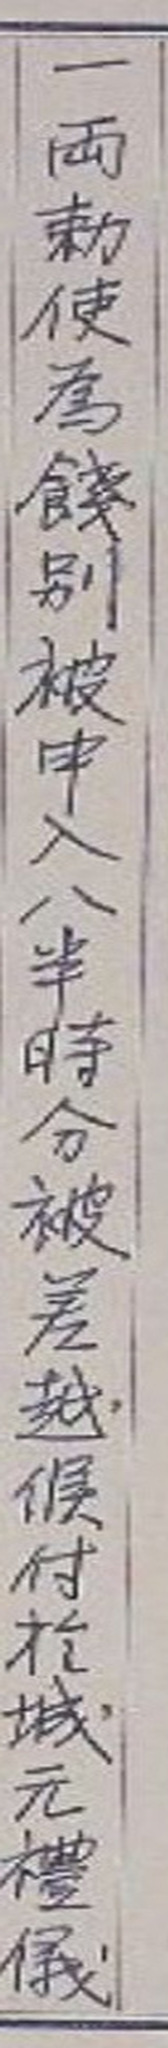一両勅使為餞別被申入八半時分被差越候付於城元礼儀
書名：支那冊封使来琉諸記 下巻
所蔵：University of the Ryukyus Library
